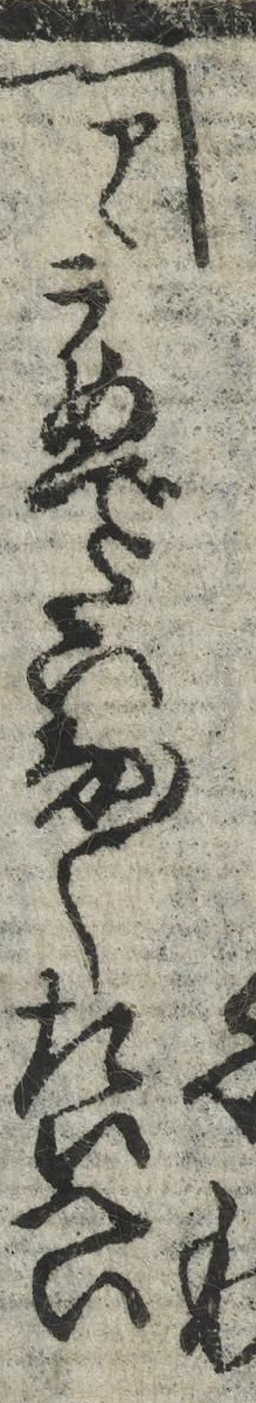〽アヽラめでたいな〳〵たいへい
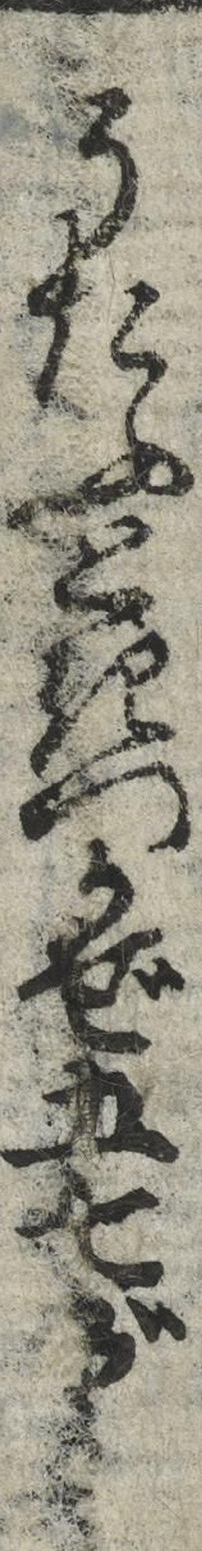うたふときつかぜ五七が
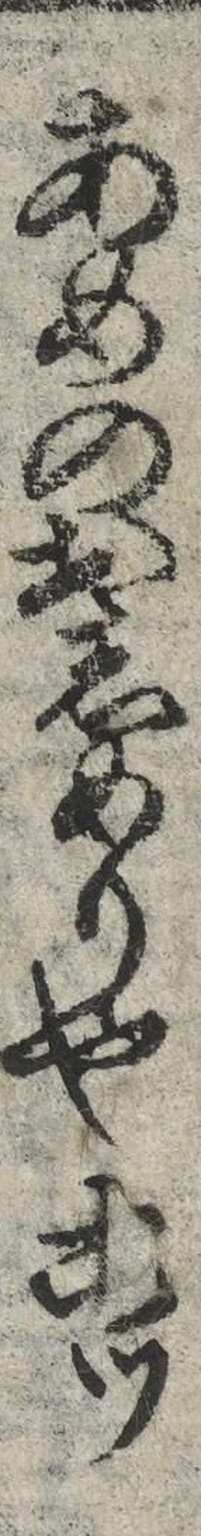あめのおしめりや六ツ
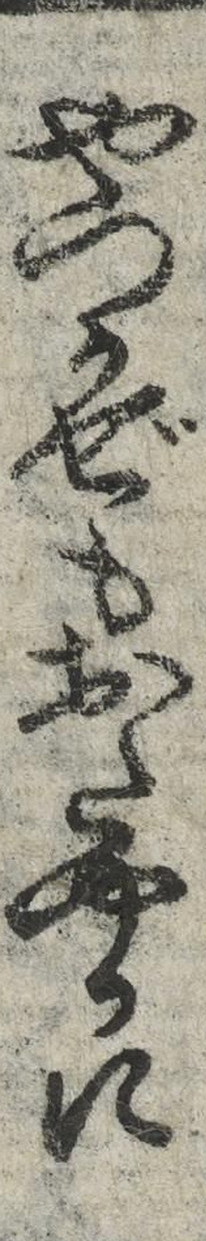やつかぜもおたやかに
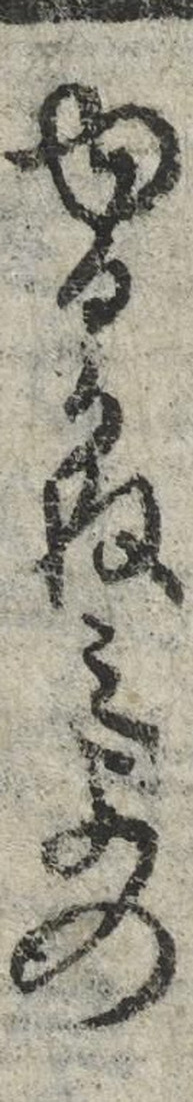ゆるかぬみよの
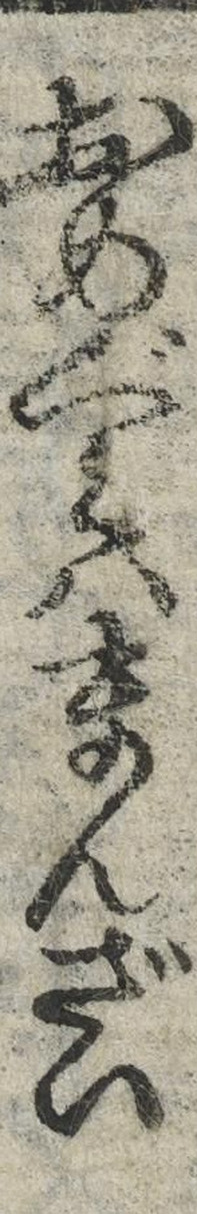おめぐみはまんざい
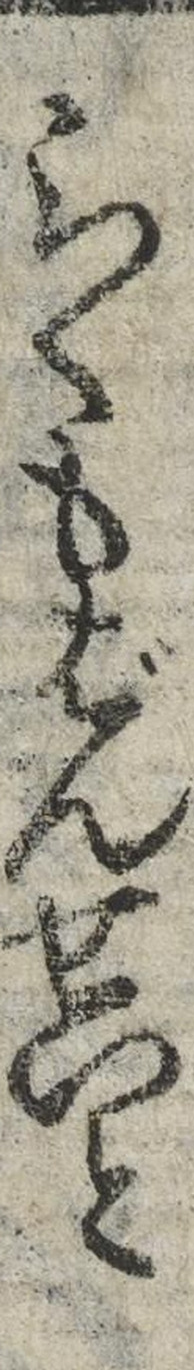らくもばんせいと
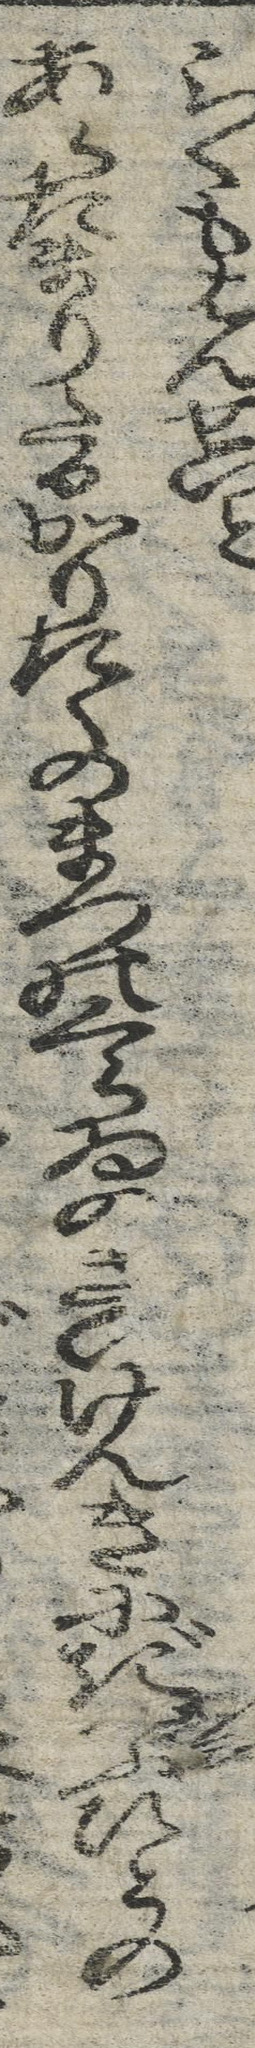あらたまりたるかりたくのまつのくらゐのさいけんきにぎはふひとの
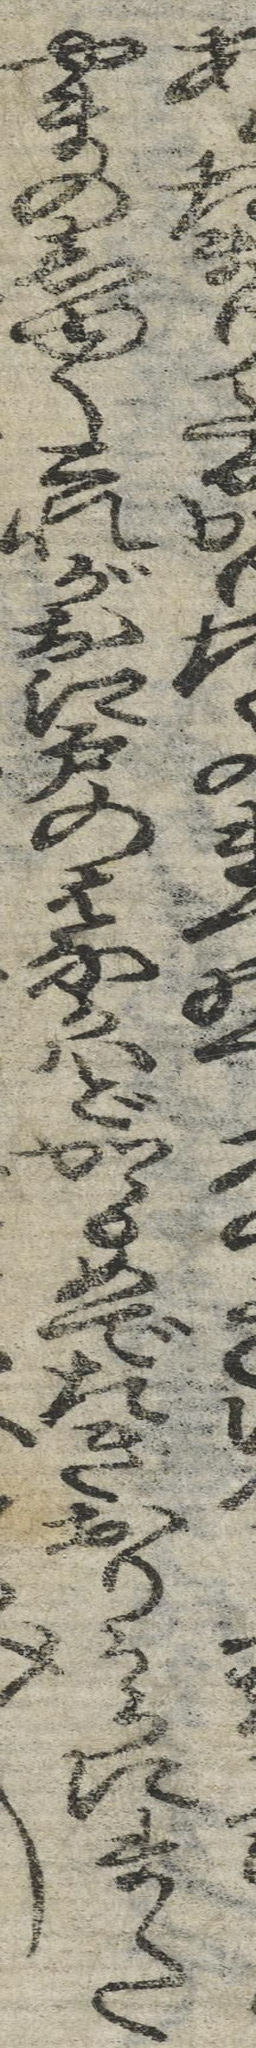やまのしゆくこれがお江戸のはなかはどかゝるめでたきおりからにまた
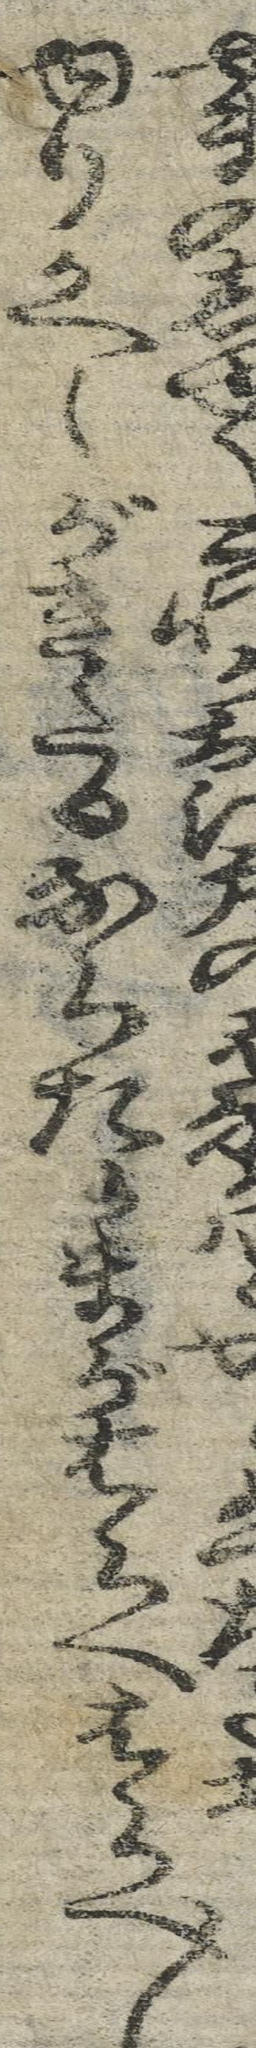ゆりかへしがきたるならたかまがはらへはらへ〳〵
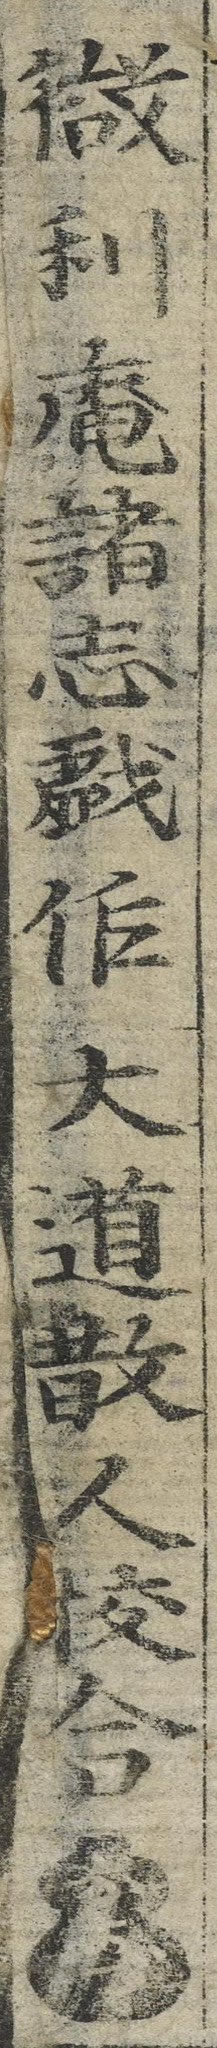微利庵諸志戯作大道散人校合なまづ
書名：地震やくはらひ
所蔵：東京大学地震研究所図書室 Earthquake Research Institute Library, The University of Tokyo, JAPAN
